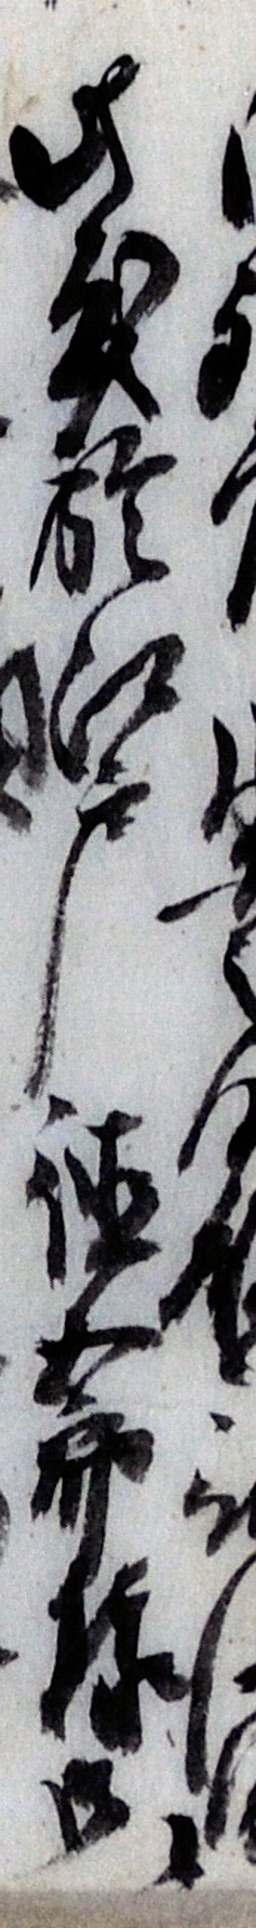此度於江戸徳五郎様御
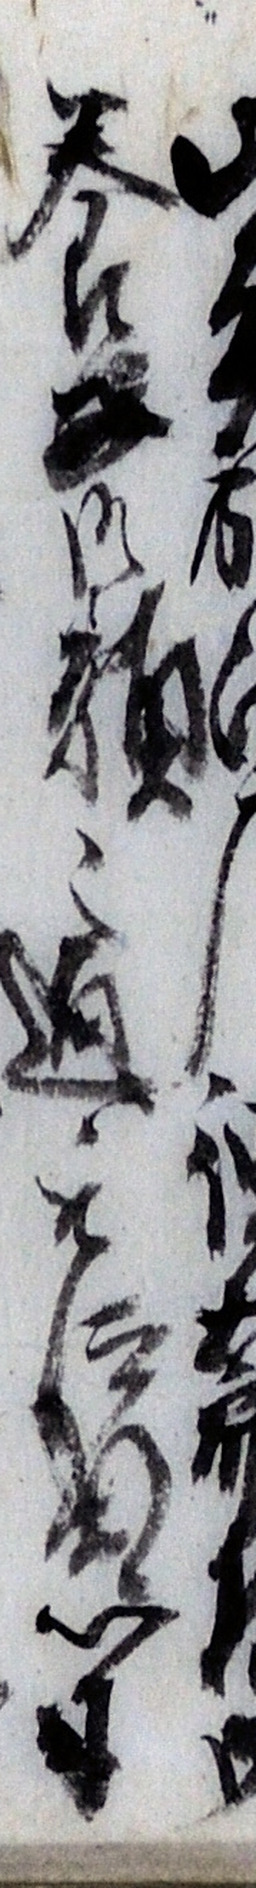養母御願之通被仰出候以上
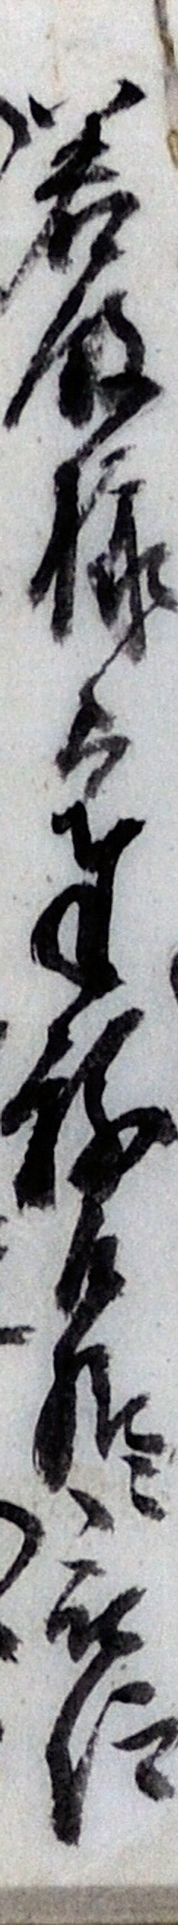若殿様被仰付候様に被仰
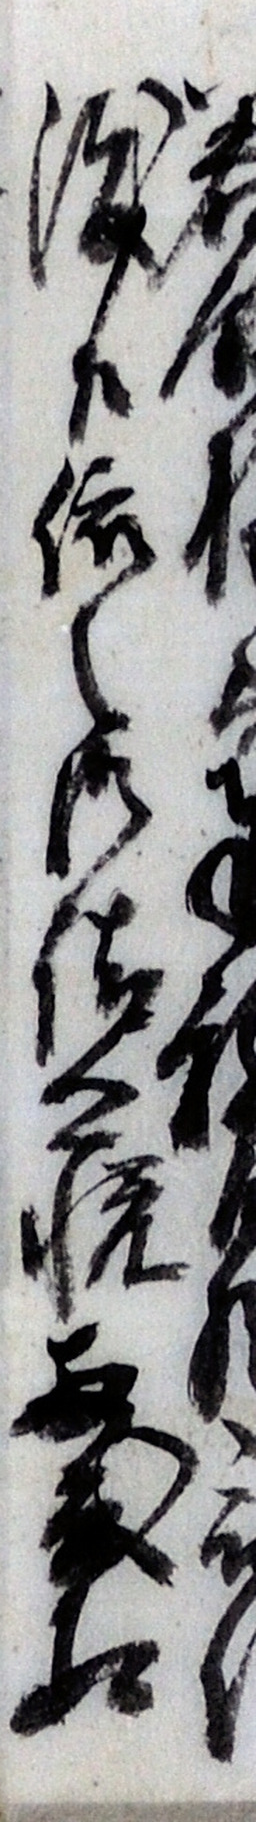渡候依之御請一悦両衣類
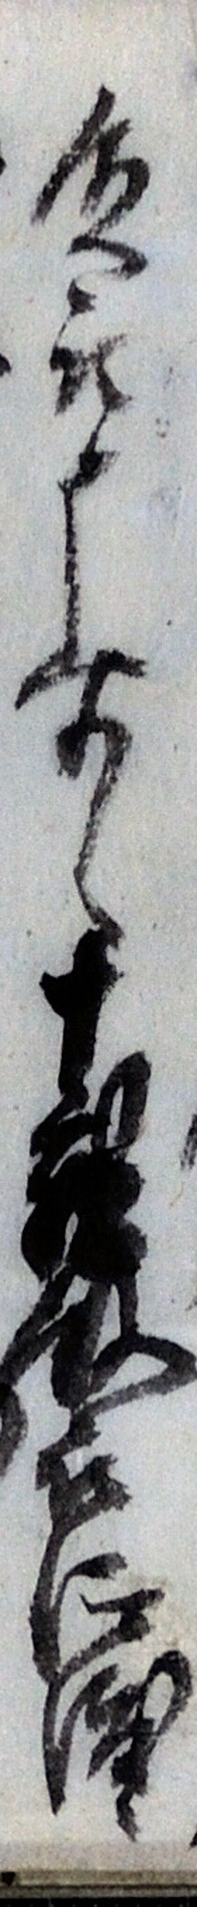殿被申聞候十蔵殿被仰渡候
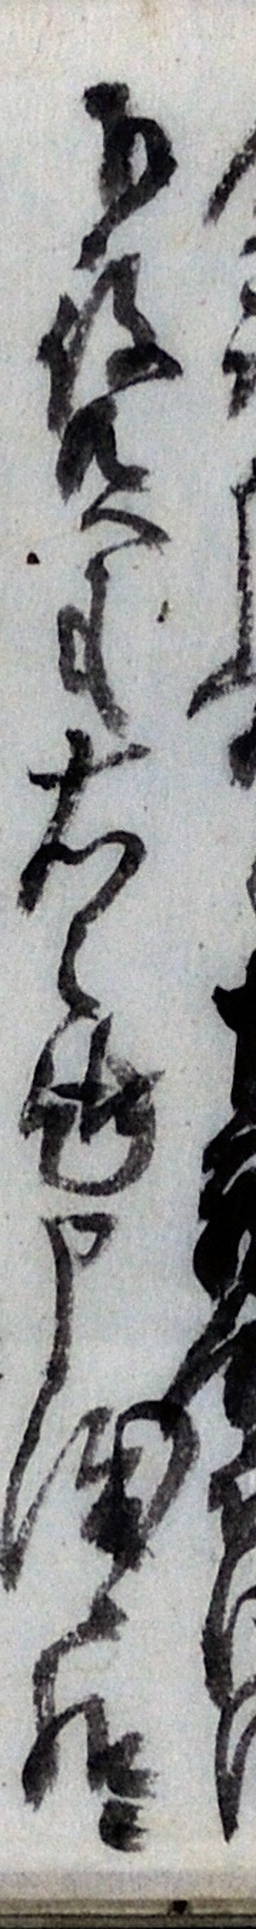下役共へも右之趣申渡候様に
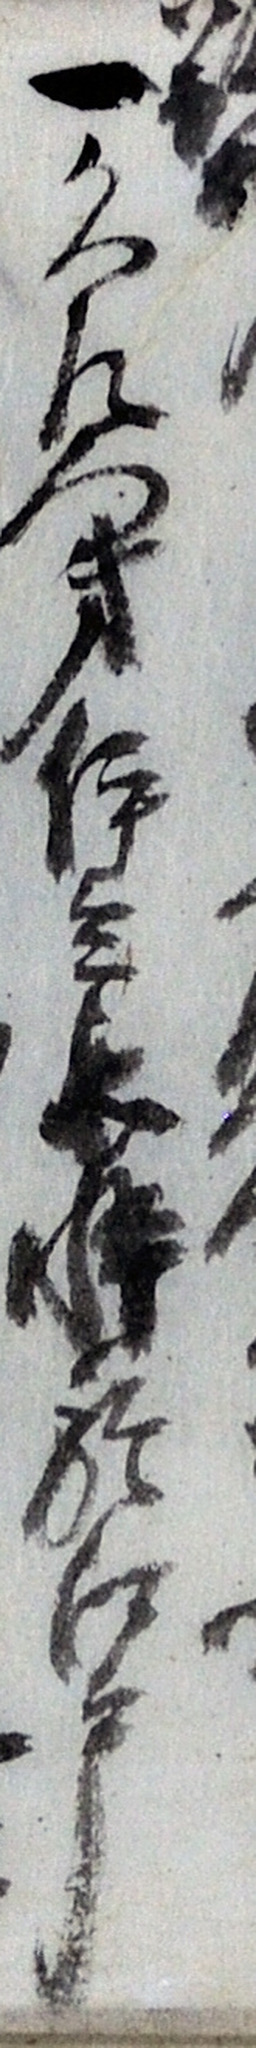一久左衛門弟伊兵衛於江戸
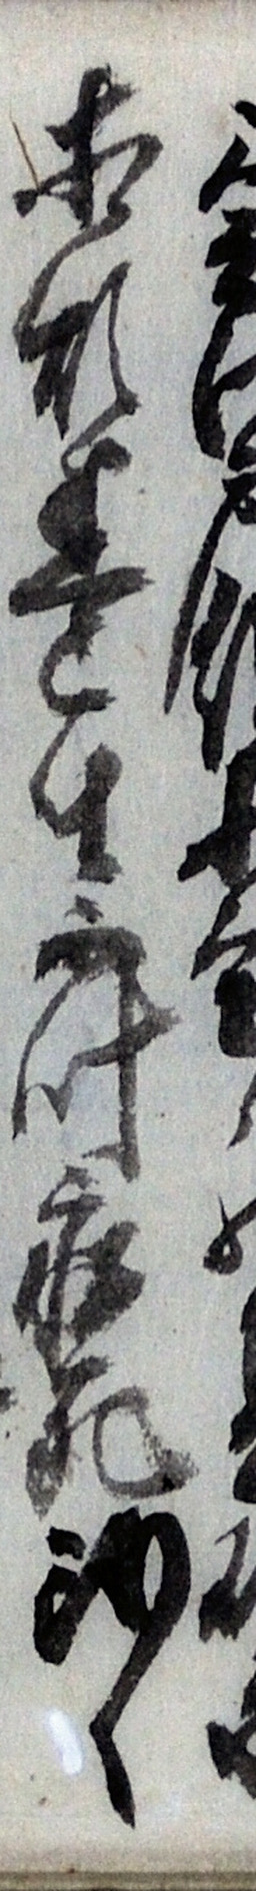相願置とも不叶病死致候
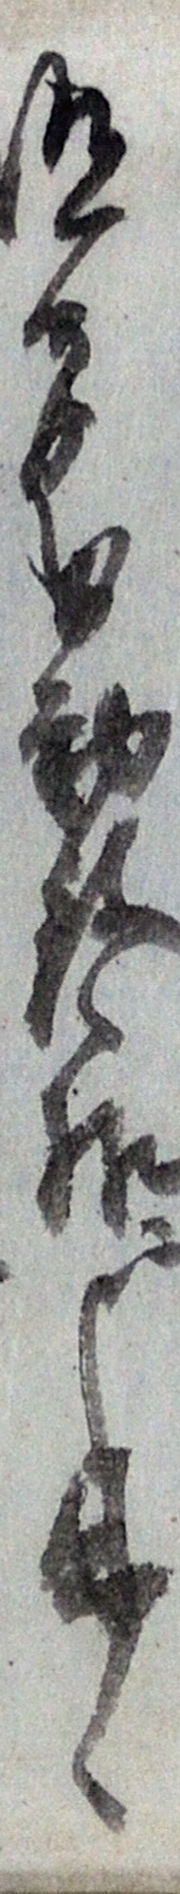但方出勤致候様に申来候
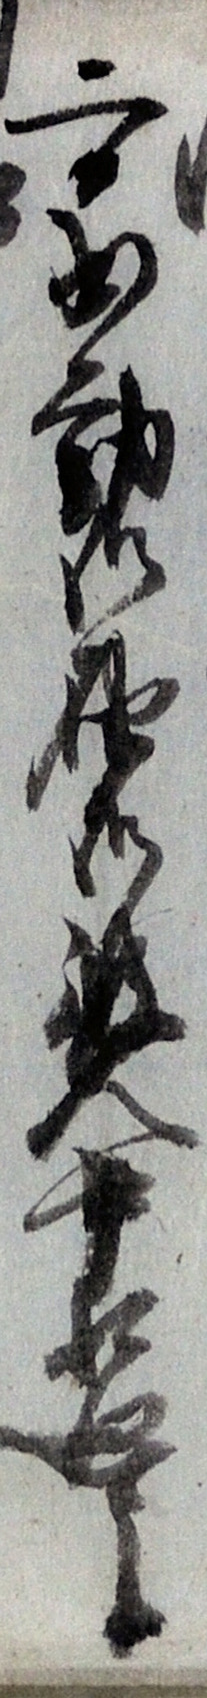二日出勤御届御役人相廻候
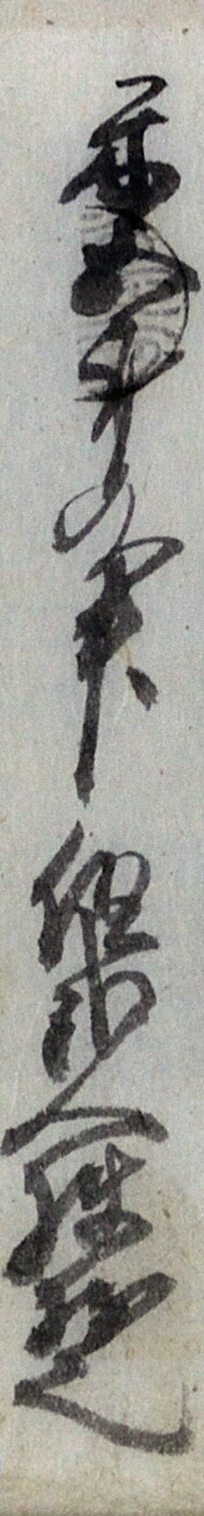米五升九ト但弐人扶持也
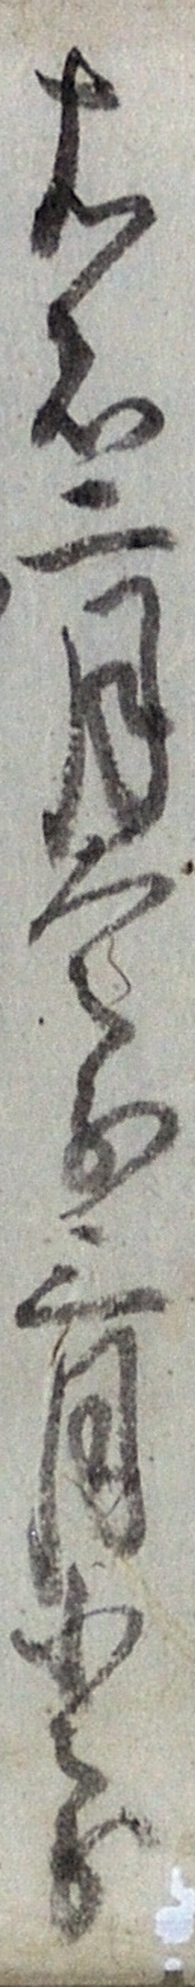右は二月太子三月等之分
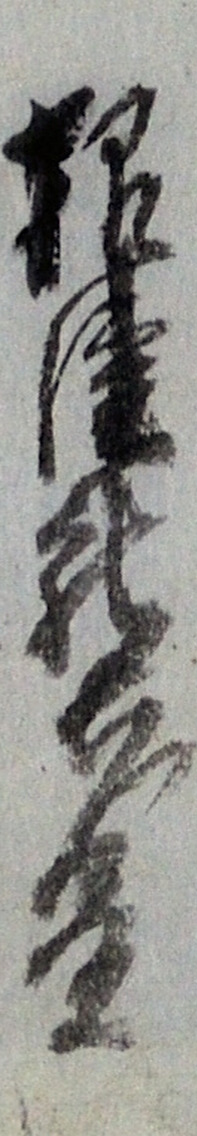根津龍右衛門
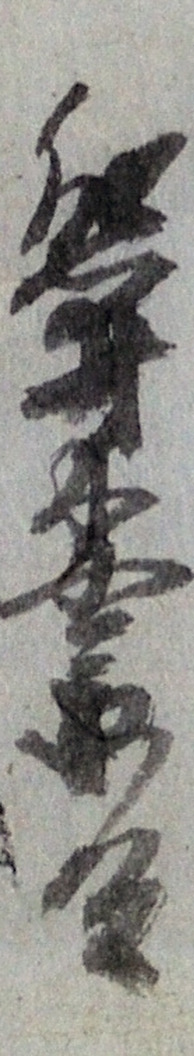熊井甚兵衛殿

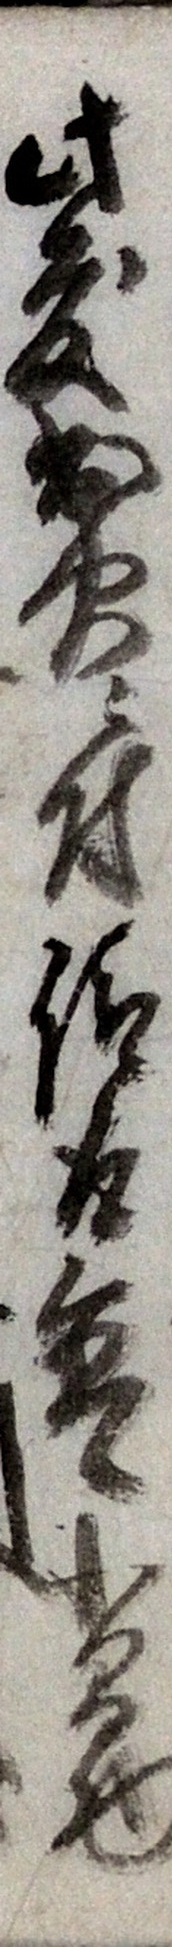此度出火二付請取置候小間物
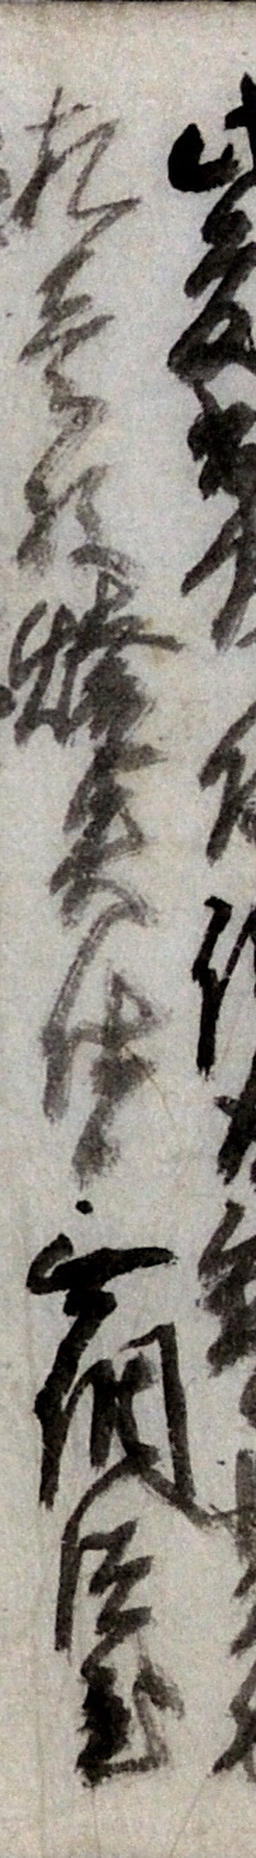札壱枚消失仕付無調法置
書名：分一方諸事御用留帳
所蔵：伊那市立高遠町図書館・合同会社AMANE
